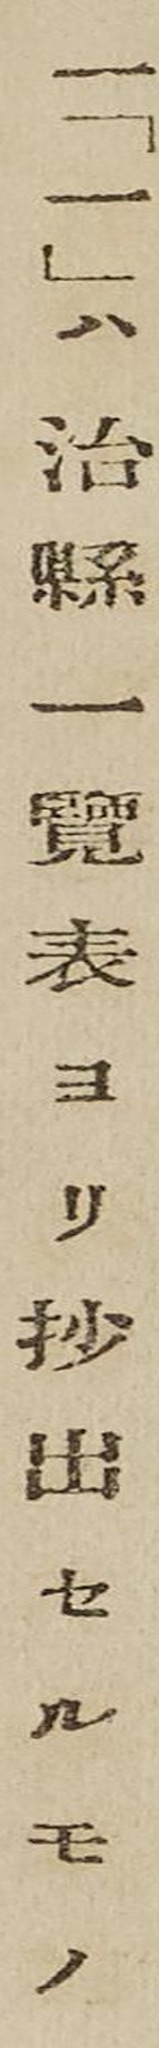一「一」ハ治県一覧表ヨリ抄出セルモノ
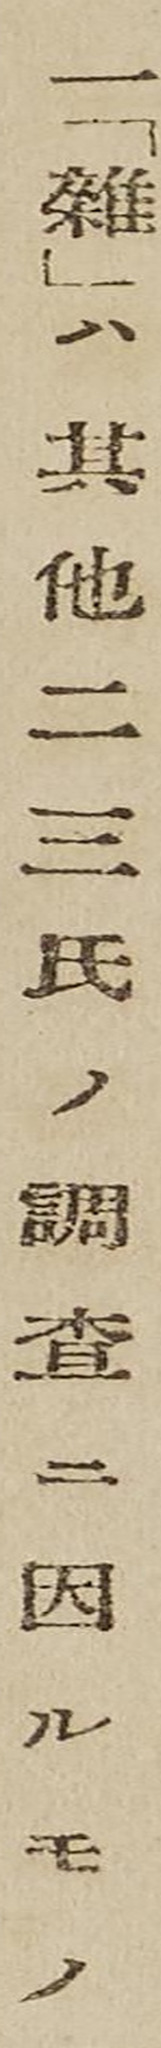一「雑」ハ其他二三氏ノ調査ニ因ルモノ

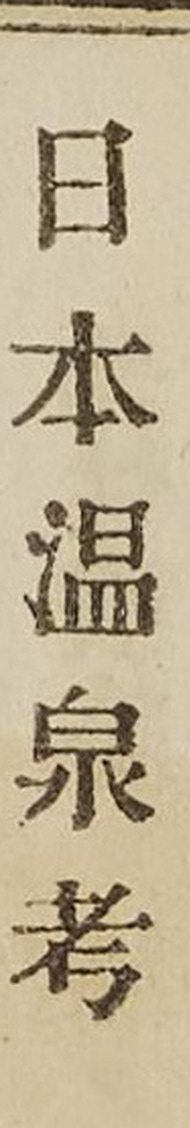日本温泉考
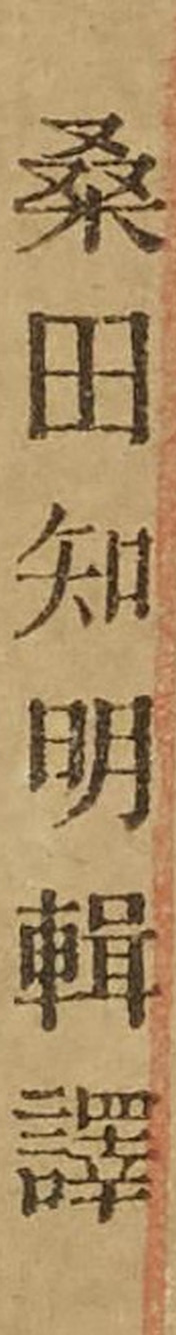桑田知明輯訳
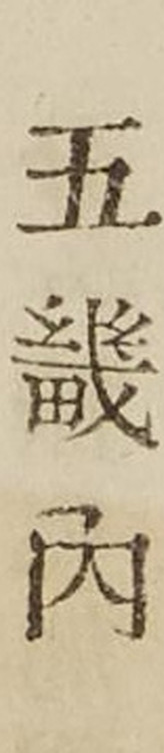五畿内

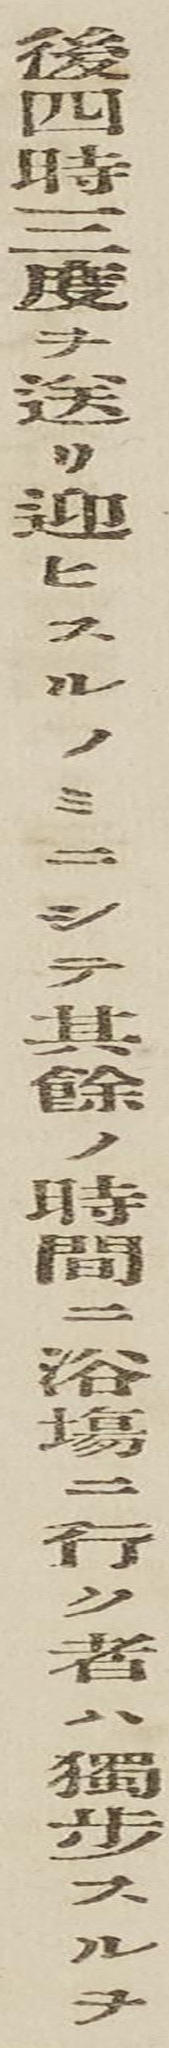後四時三度ヲ送リ迎ヒスルノミニシテ其余ノ時間ニ浴場ニ行ク者ハ独歩スルヲ定規トス
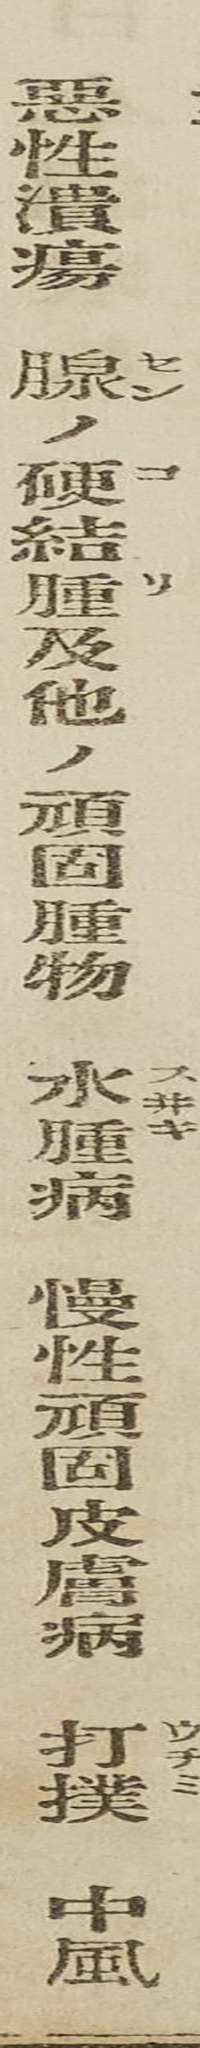如シ悪性潰瘍腺ノ硬結腫及他ノ頑固腫物水腫病慢性頑固皮膚病打撲中風

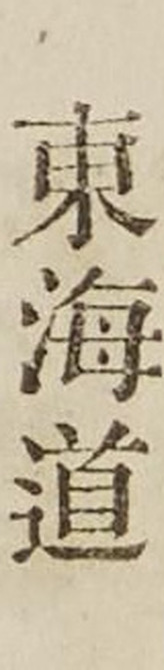東海道

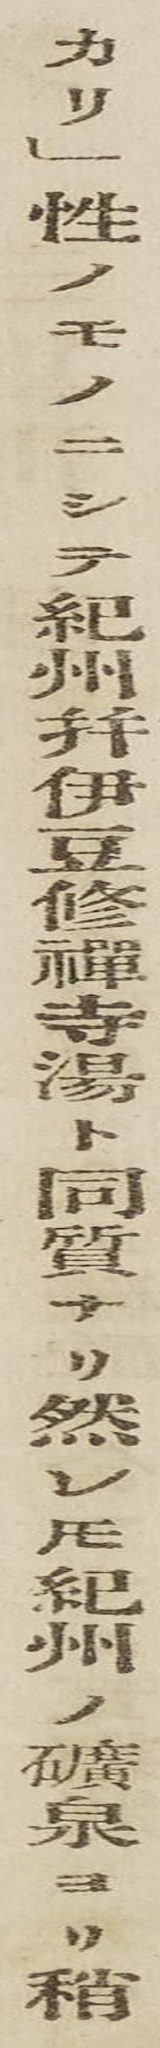カリ」性ノモノニシテ紀州并伊豆修禅寺湯ト同質ナリ然レトモ紀州ノ礦泉ヨリ稍弱シ
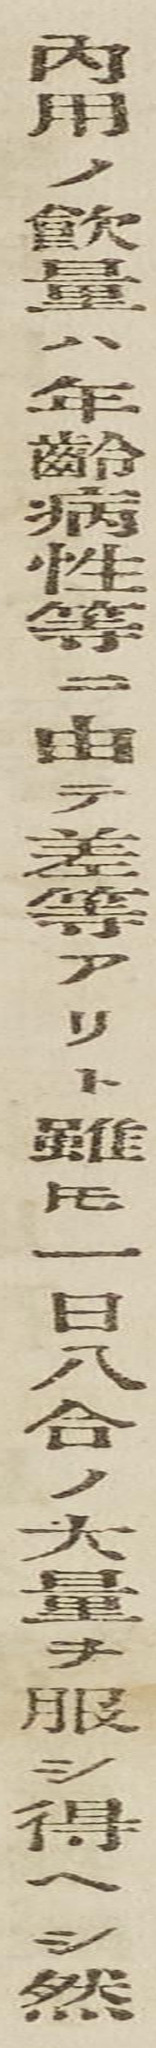内用ノ飲量ハ年齢病性等ニ由テ差アリト雖トモ一日八合ノ大量ヲ服シ得ヘシ然

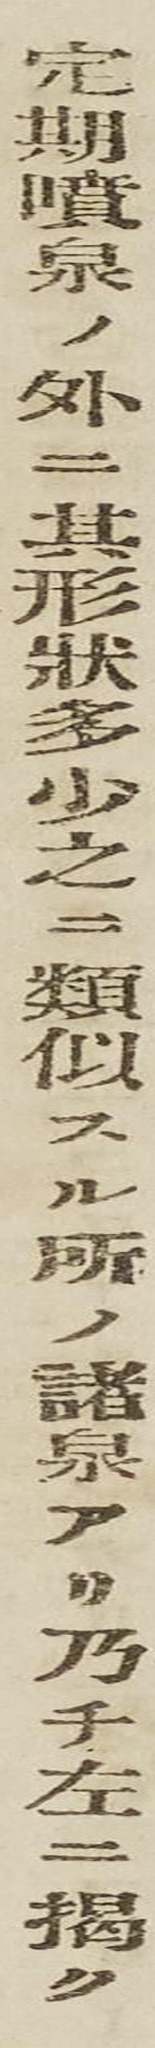定期噴泉ノ外ニ其形状多少之ニ類似スル所ノ諸泉アリのチ左ニ掲ク
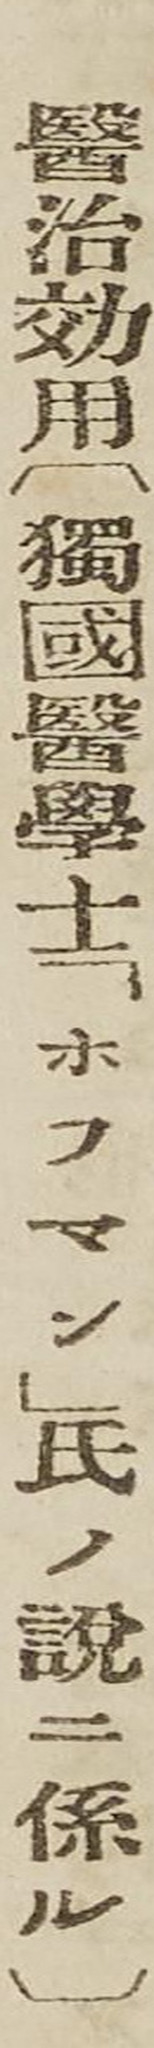医治効用〔独国医学士「ホフマン」氏ノ説ニ係ル〕

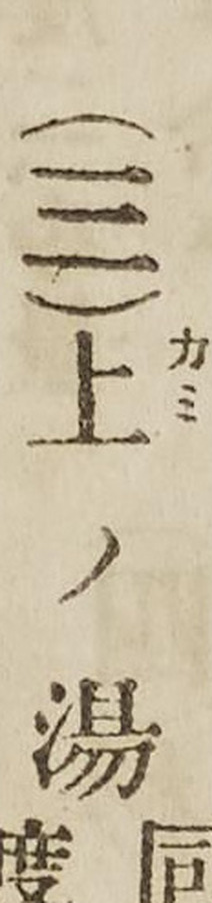谷ノ湯
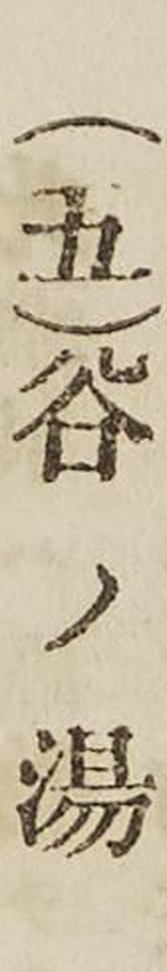谷ノ湯

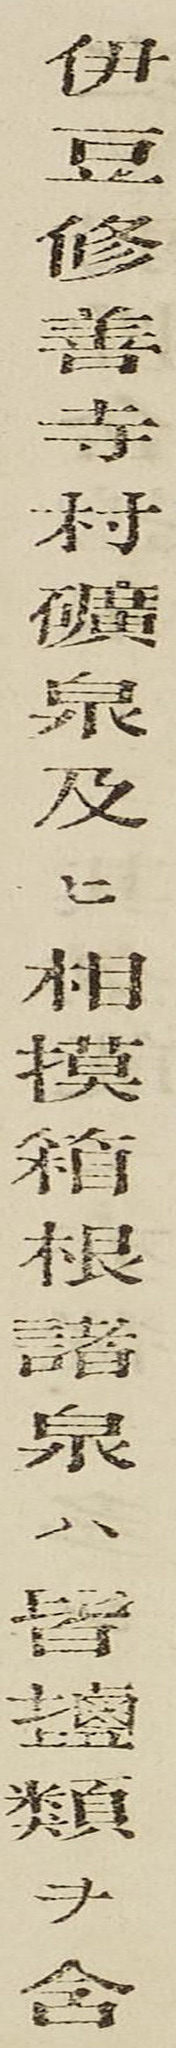伊豆修善寺村礦泉及ヒ相模箱根諸泉ハ皆塩類ヲ含
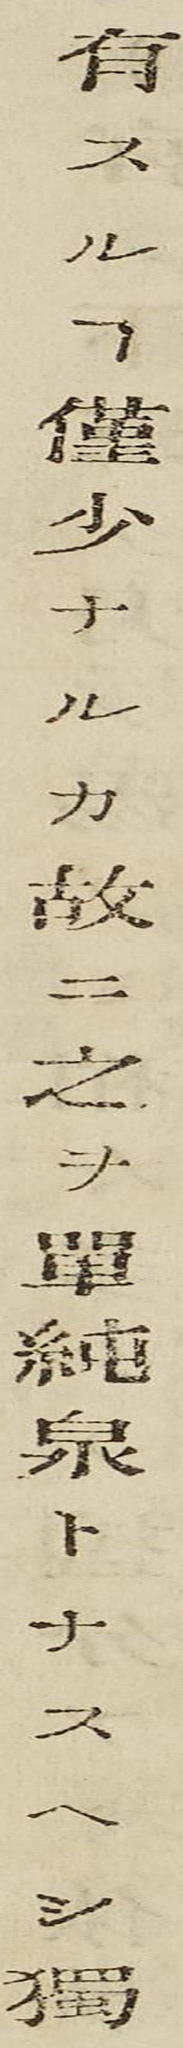有スルコト僅少ナルカ故ニ之ヲ単純泉トナスヘシ独
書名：日本温泉考
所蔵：東京大学地震研究所図書室 Earthquake Research Institute Library, The University of Tokyo, JAPAN
